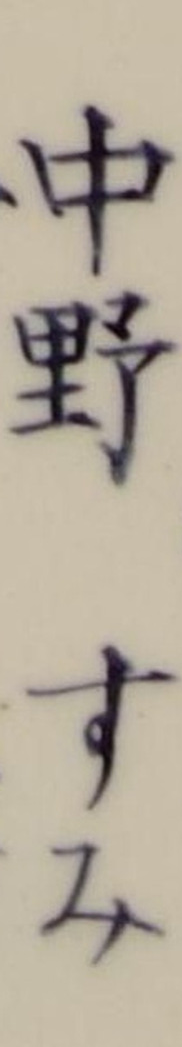中野すみ
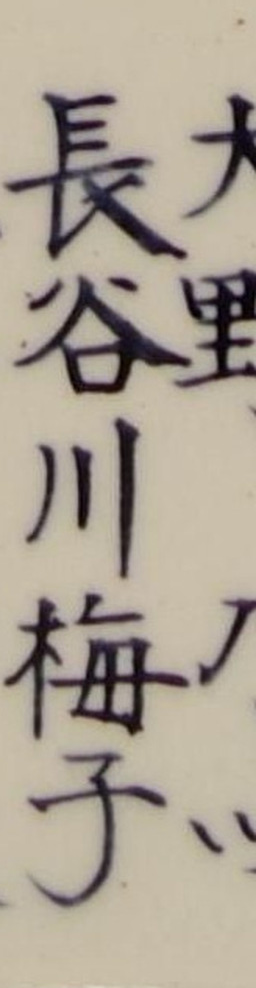長谷川梅子
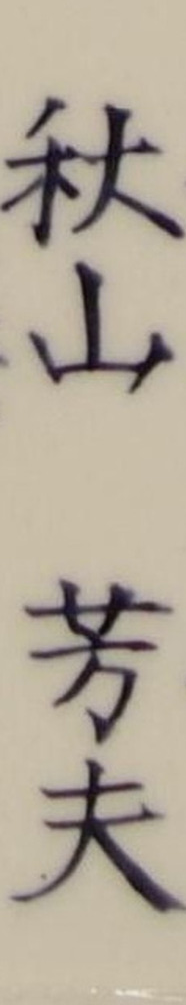秋山芳夫
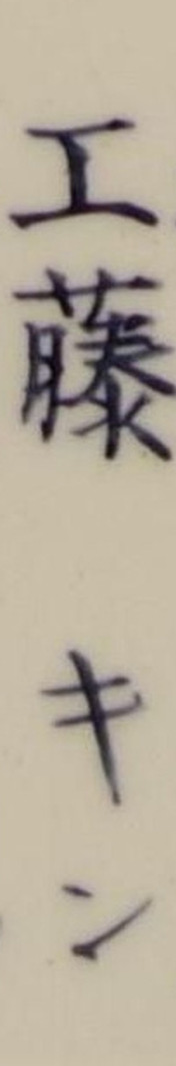工藤キン
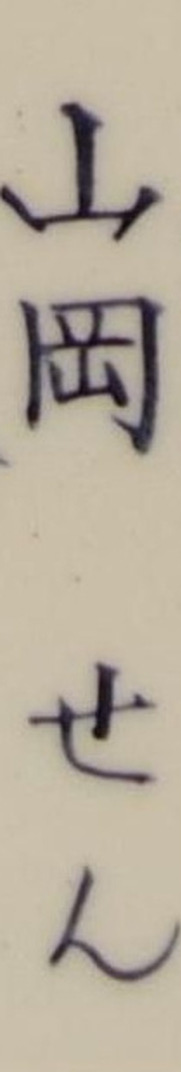山岡せん
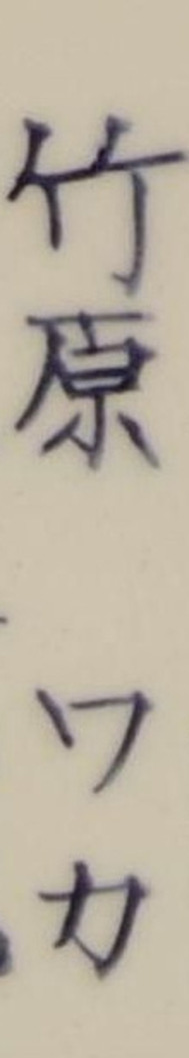竹原ワカ
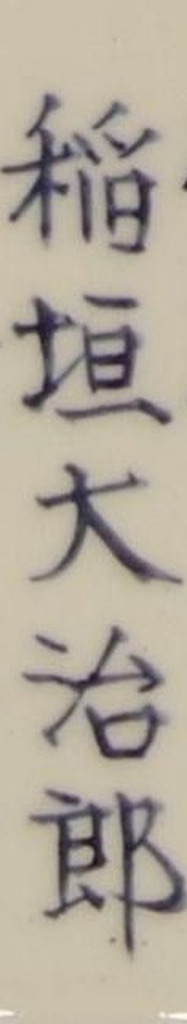稲垣大治郎

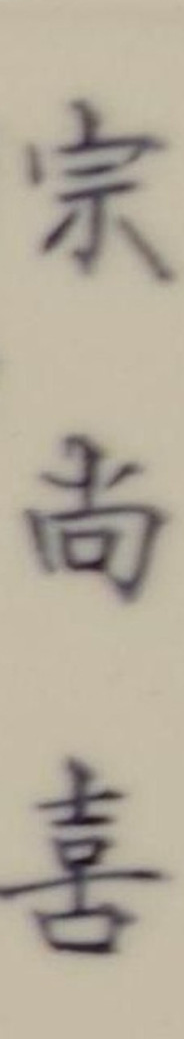宗尚喜
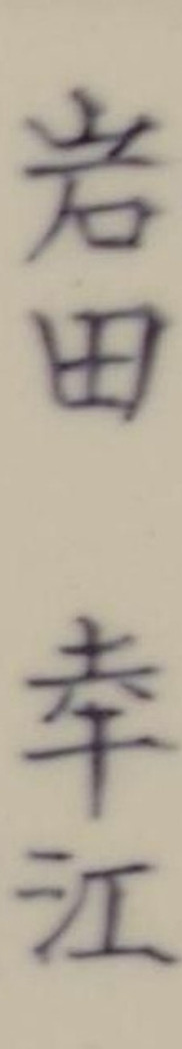岩田幸江
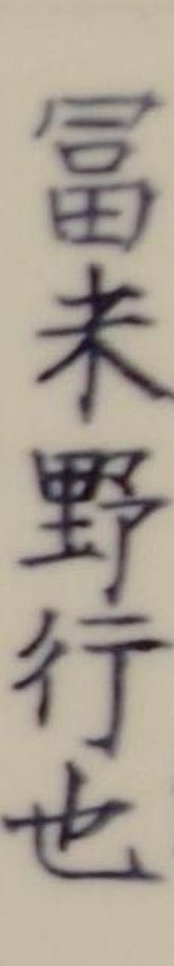冨未野行也
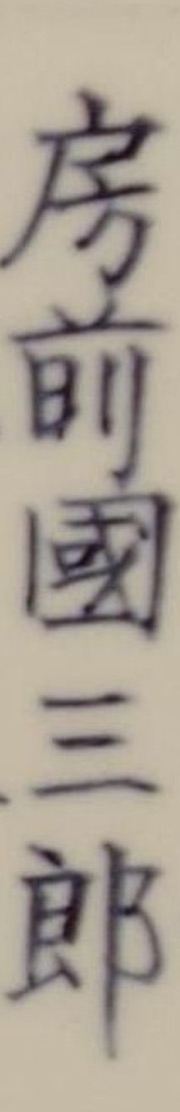房前國三郎
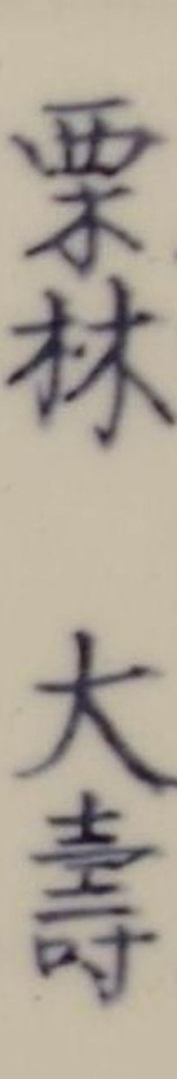栗林大寿
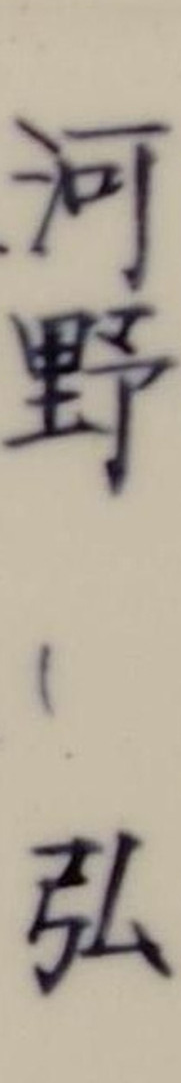河野弘
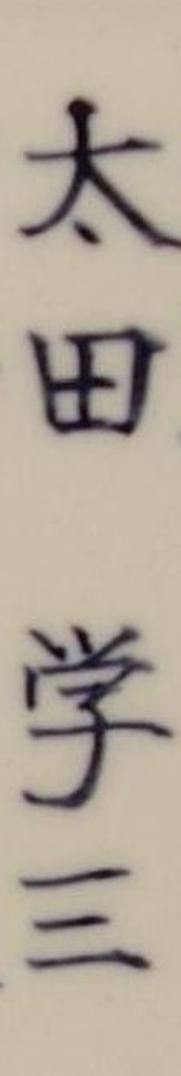太田学三
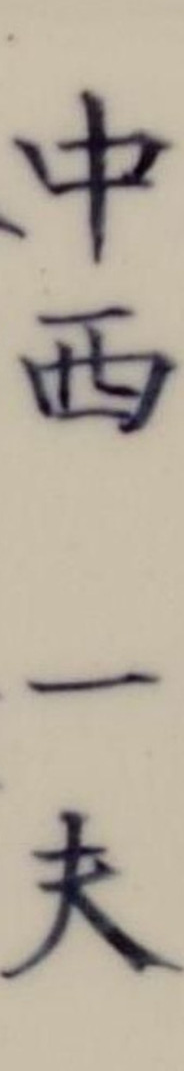中西一夫
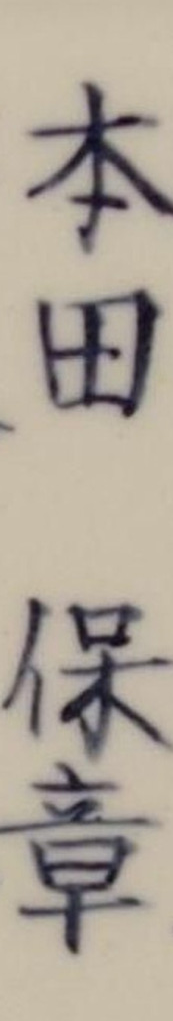本田保章
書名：M~S
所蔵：高野山金剛峯寺
